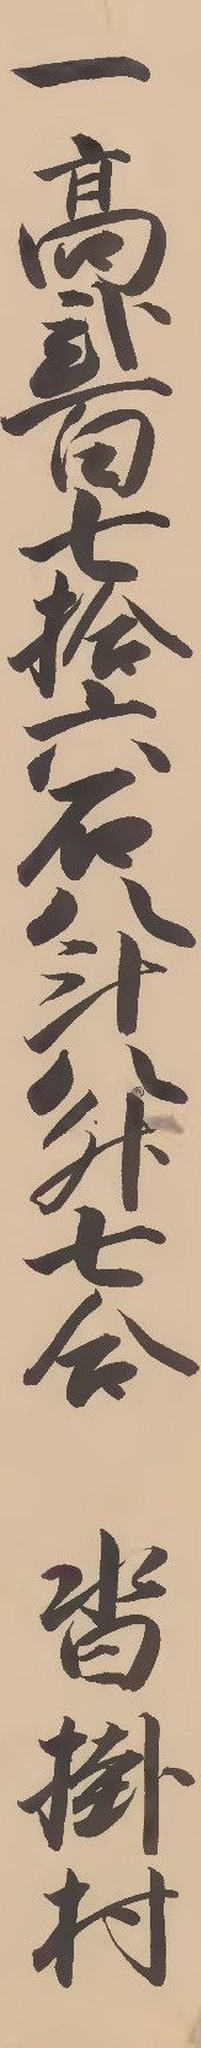一高弐百七拾六石八斗八升七合沓掛村
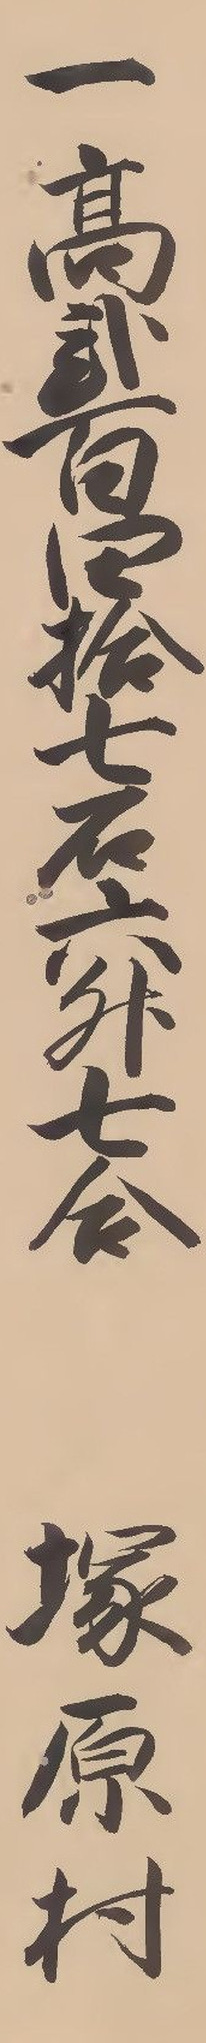一高弐百四拾七石六升七合塚原村
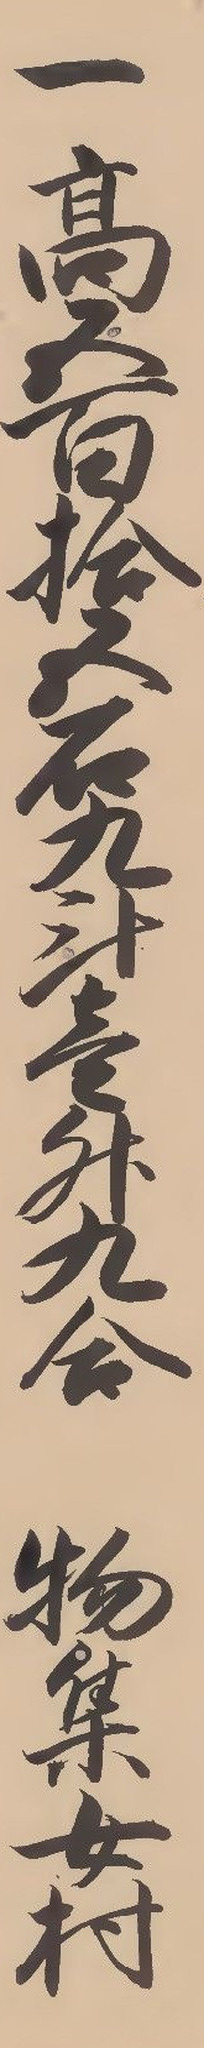一高五百拾五石九斗壱升九合物集女村
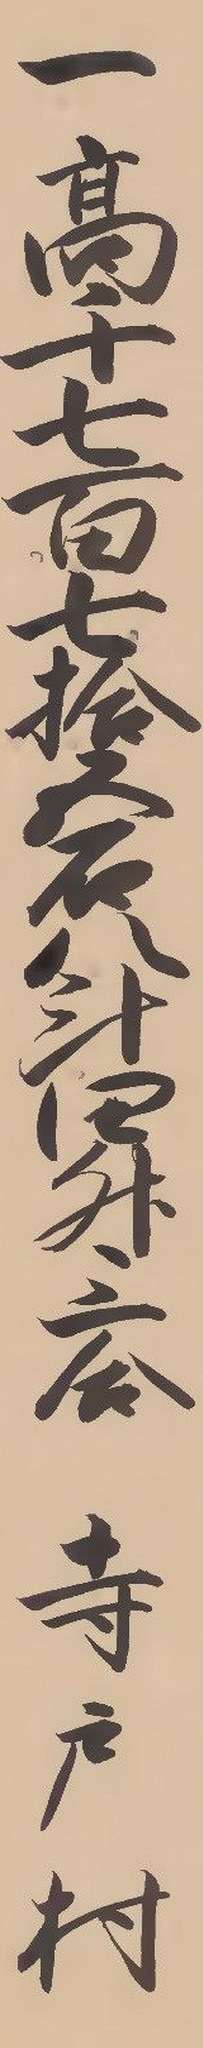一高千七百七拾五石八斗四升三合寺戸村
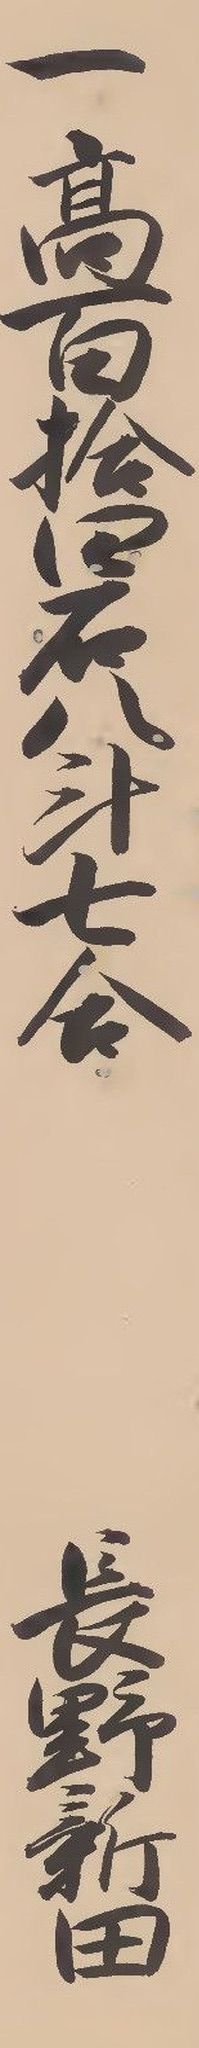一高百拾四石八斗七合長野新田
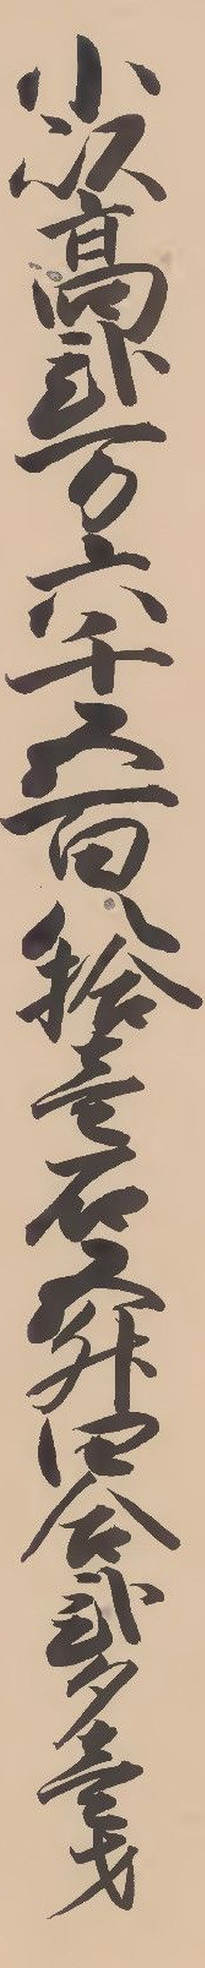小以高弐万六千五百八拾壱石五升四合弐勺壱才

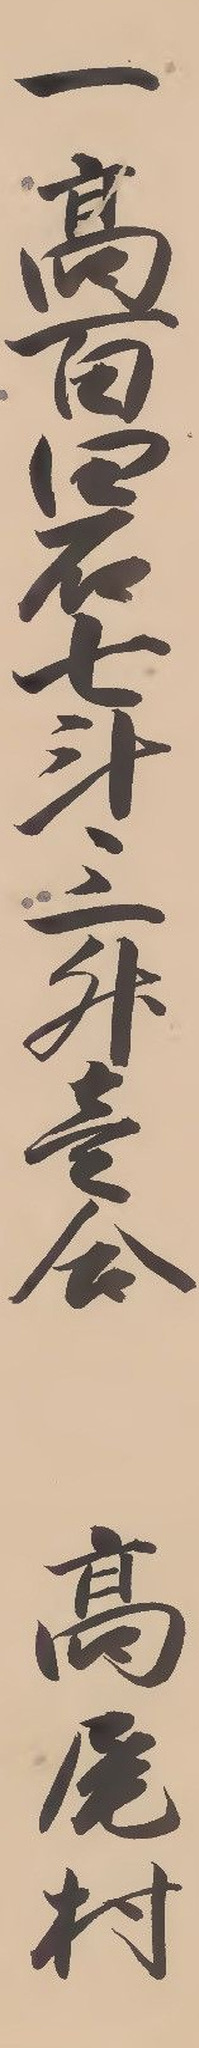一高百四石七斗三升壱合高尾村
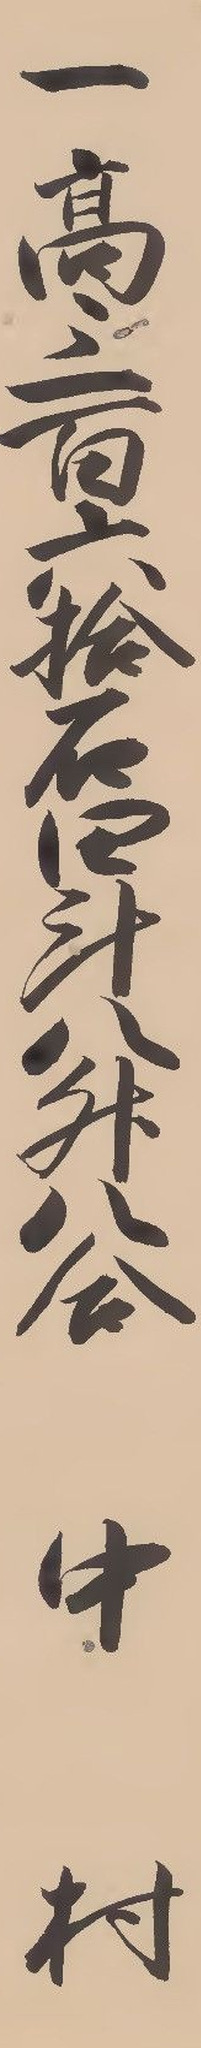一高三百六拾石四斗八升八合中村
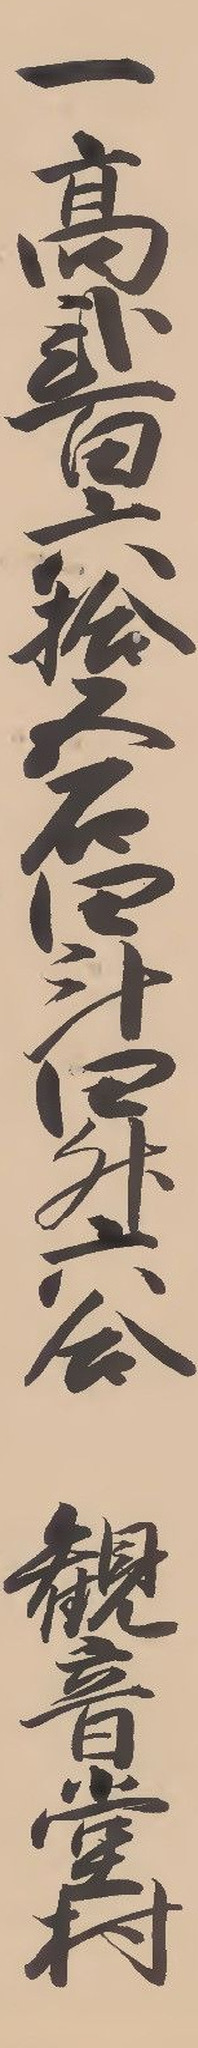一高弐百六拾五石四斗四升六合観音堂村
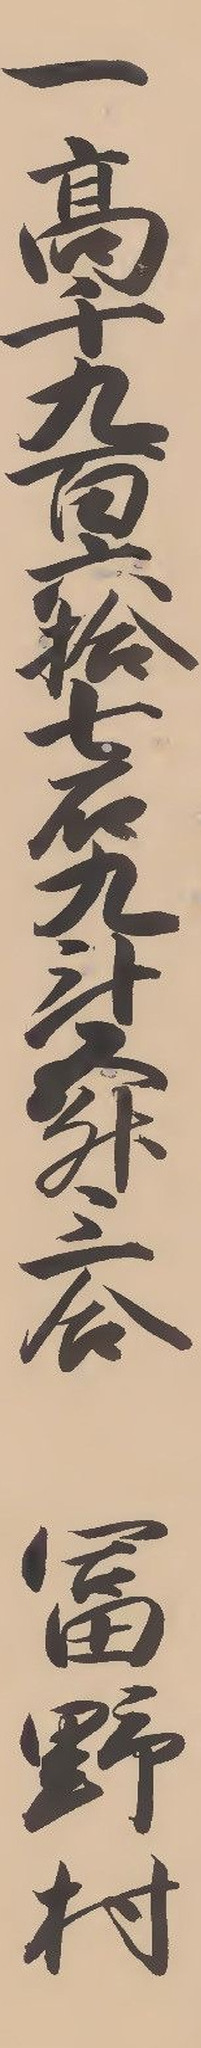一高千九百六拾七石九斗五升三合富野村
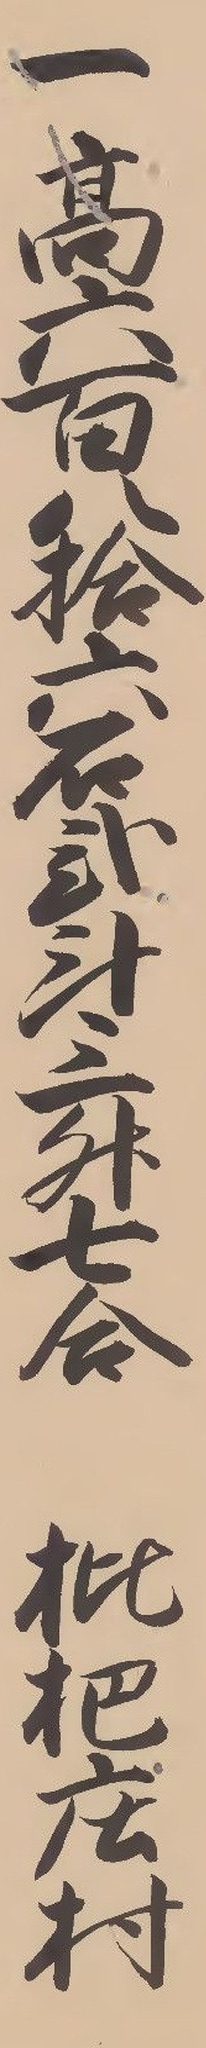一高六百八拾六石弐斗三升七合枇杷庄村
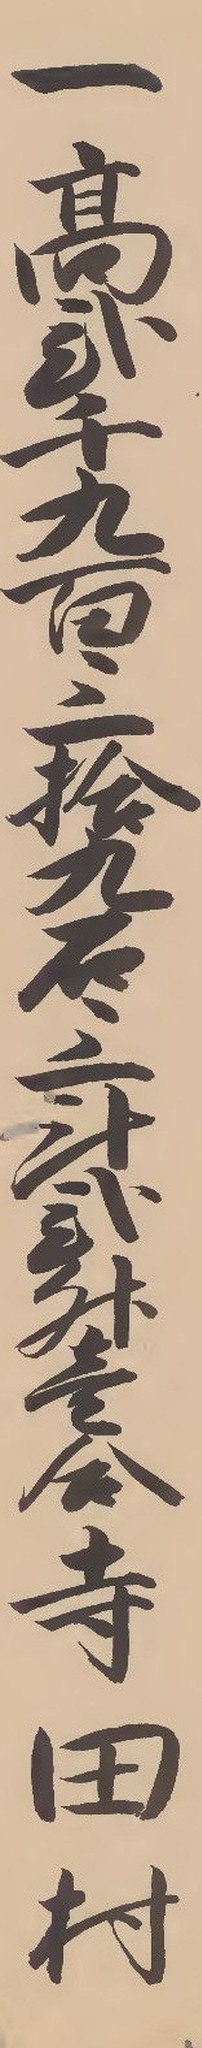一高弐千九百三拾九石三斗弐升壱合寺田村

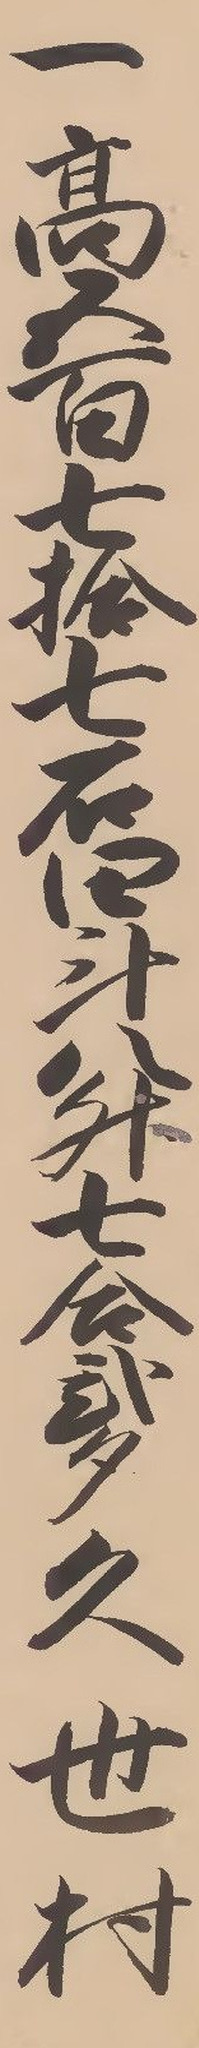一高五百七拾七石四斗八升七合弐勺久世村
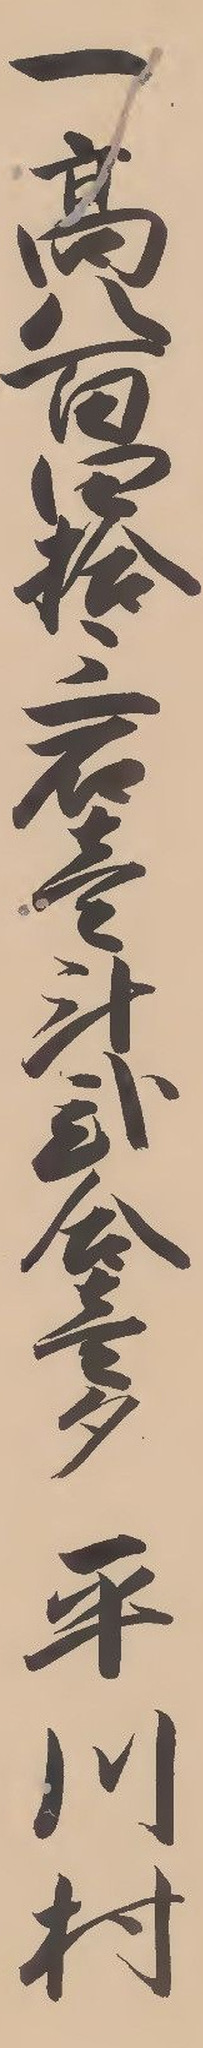一高八百四拾三石壱斗弐合壱勺平川村
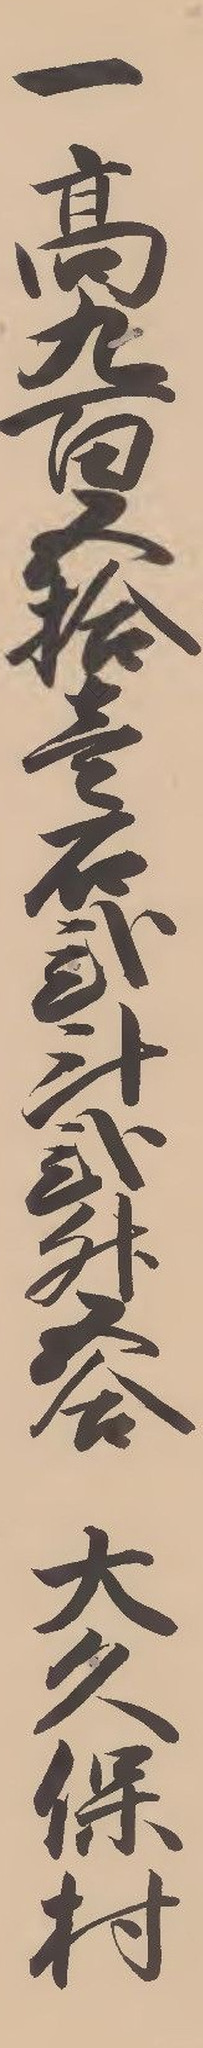一高九百五拾壱石弐斗弐升五合大久保村
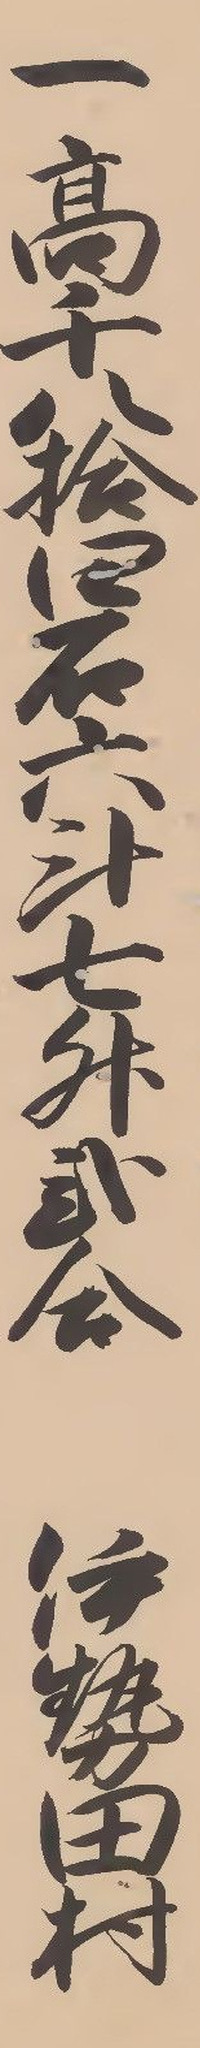一高千八拾四石六斗七升弐合伊勢田村
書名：山城国郷帳
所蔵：国立公文書館 National Archives of Japan
